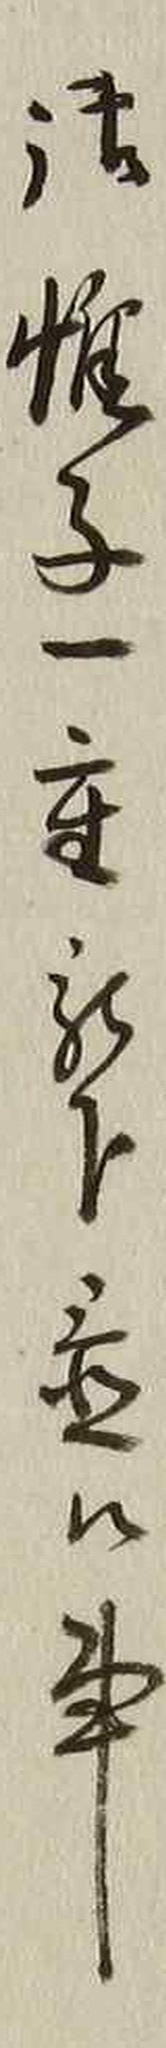御帷子一重被下置候事
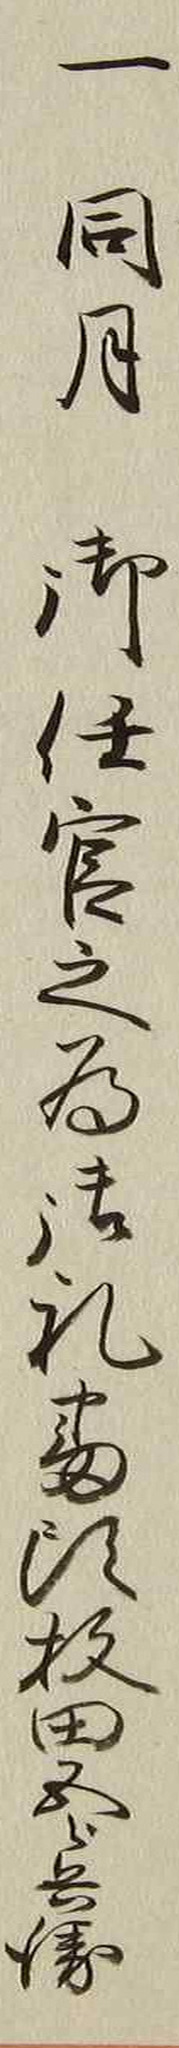一同月御任官之為御礼番頭杉田五郎兵衛
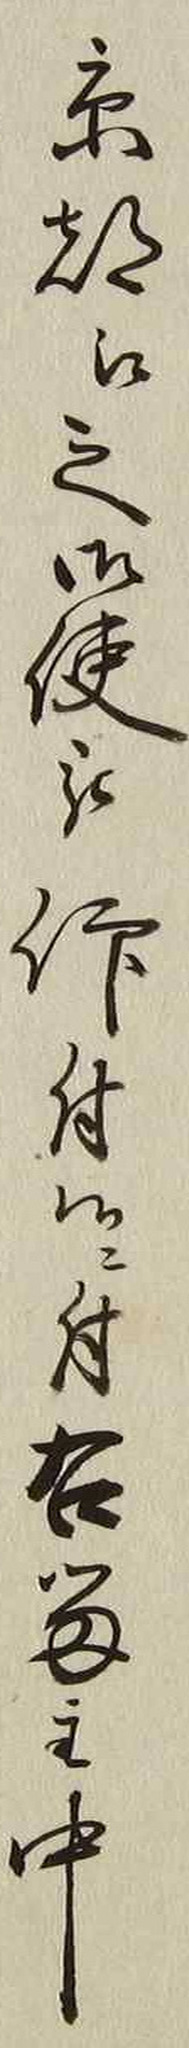京都江之御使被仰付候ニ付右留守中
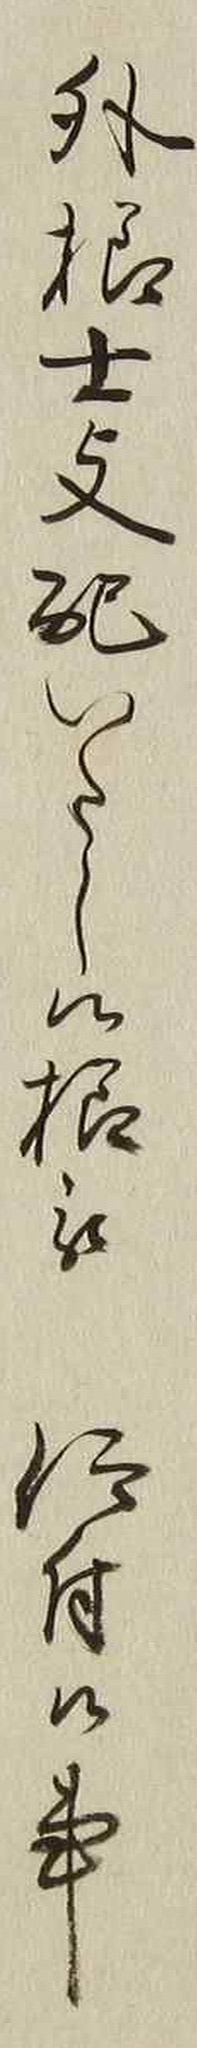外様士支配いたし候様被仰付候事
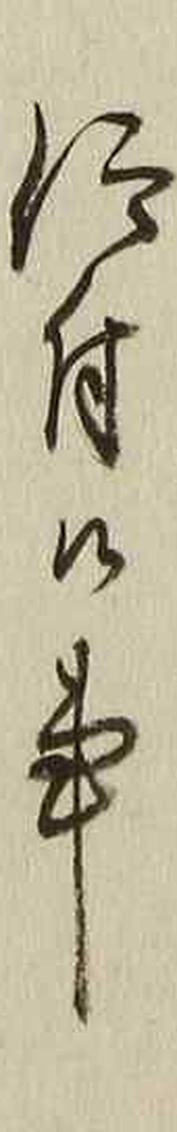仰付候事
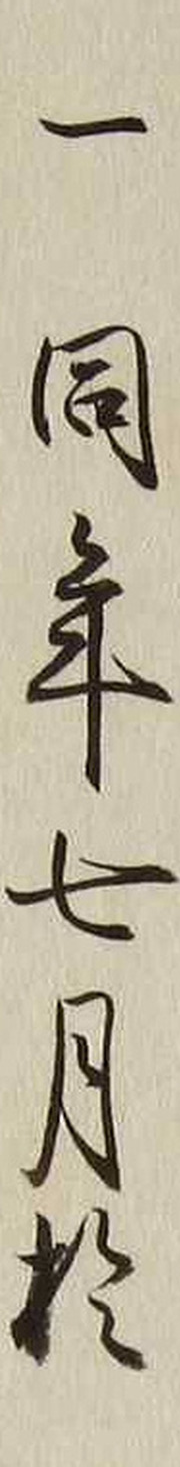一同年七月於
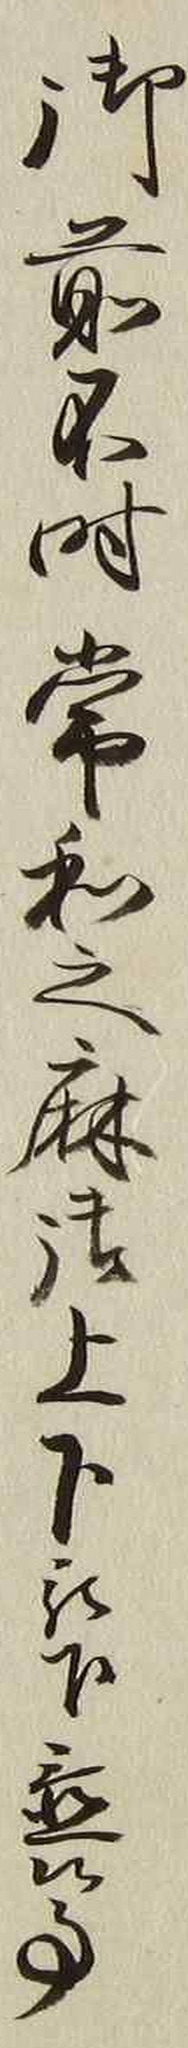御前不時常和之麻御上下被下置候事
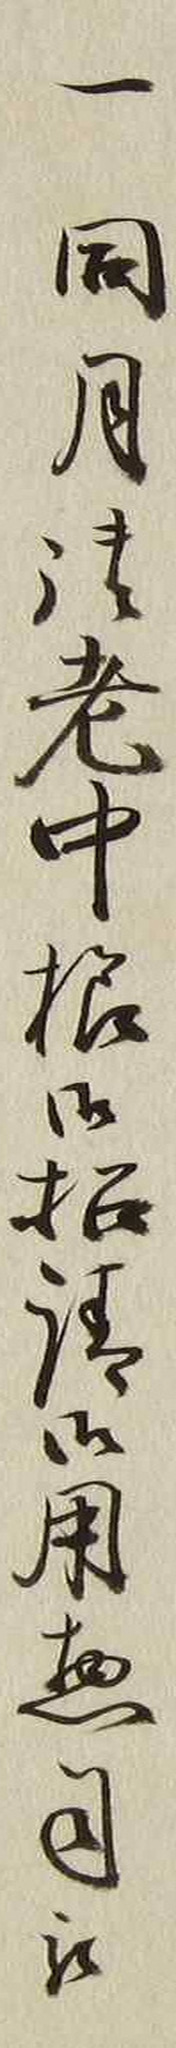一同月御老中様御招請御用惣司被
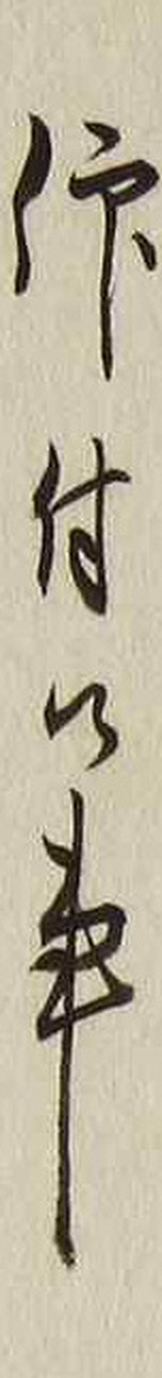仰付候事
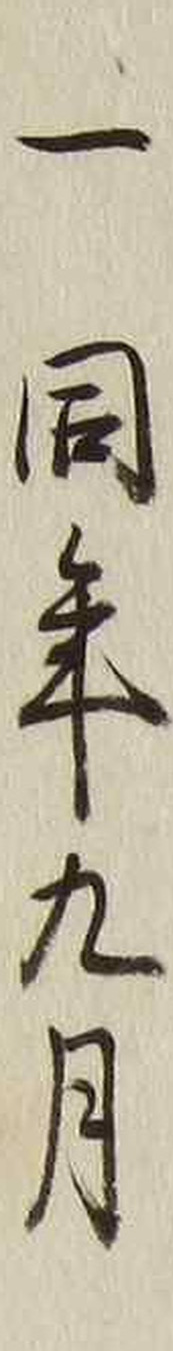一同年九月
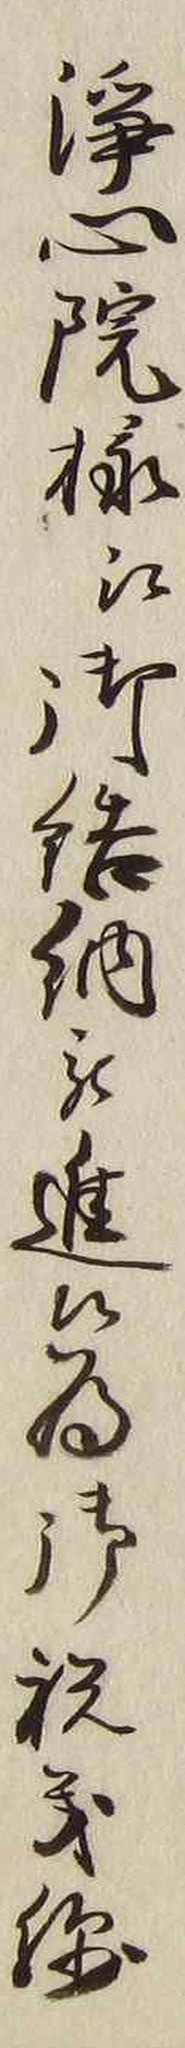浄心院様江御結納被進候為御祝義綿
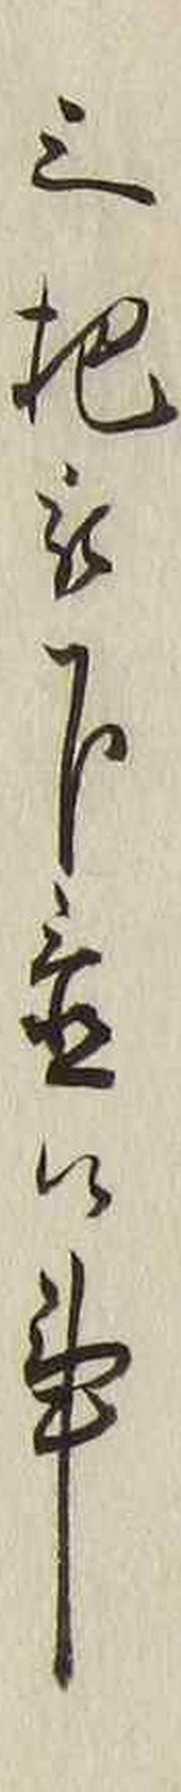三把被下置候事

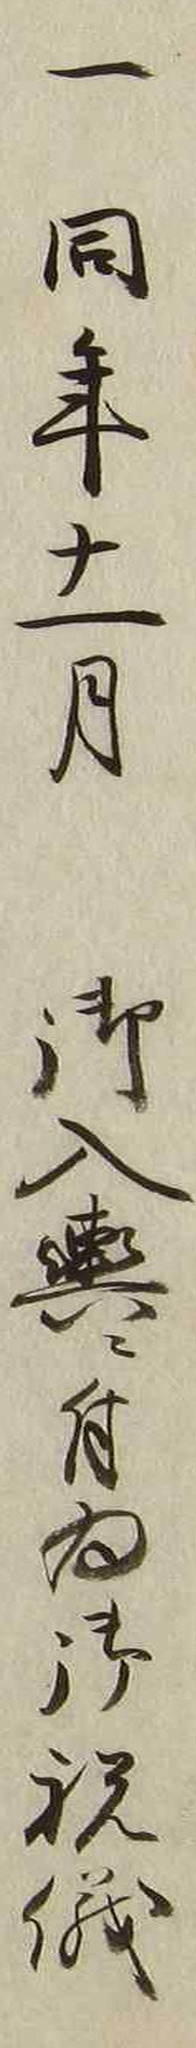一同年十一月御入輿ニ付為御祝儀
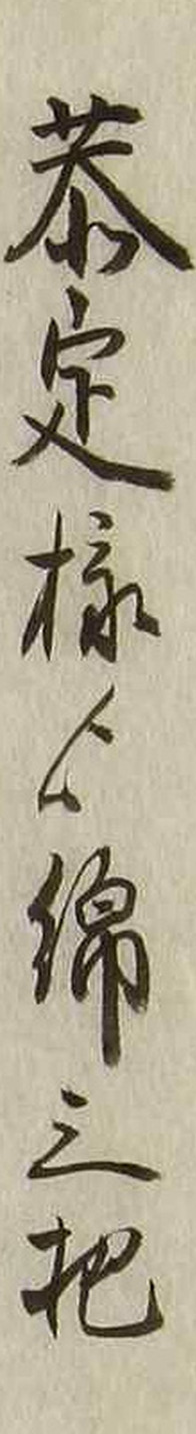恭定様ゟ綿三把
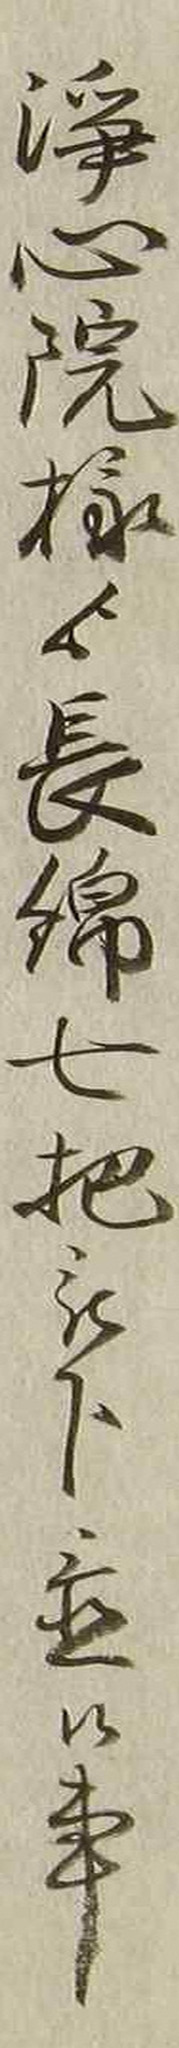浄心院様ゟ長綿七把被下置候事
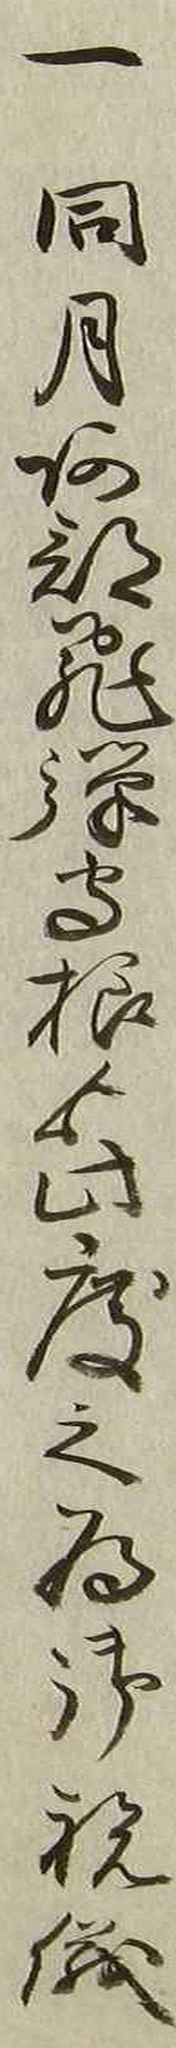一同月阿部飛騨守様ゟ此度之為御祝儀
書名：諸士系譜　巻之15　い之部15
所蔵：会津若松市立会津図書館
